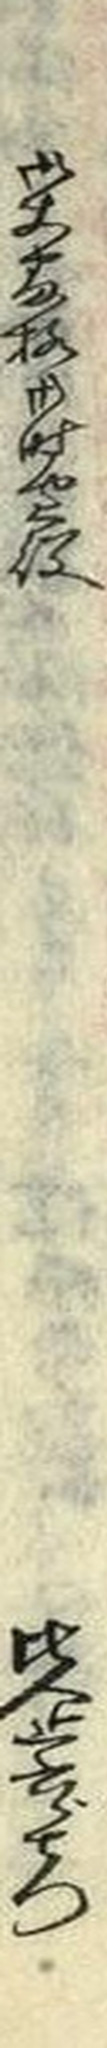御使番格御時宜役比企六郎右衛門
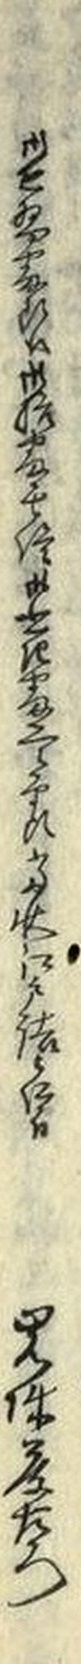御近習番頭取御膳番其儘御書院番二之筆頭当秋江戸詰被仰付岩城藤左衛門
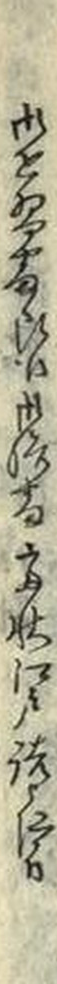御近習頭取御膳番当秋江戸詰被仰付中村久蔵

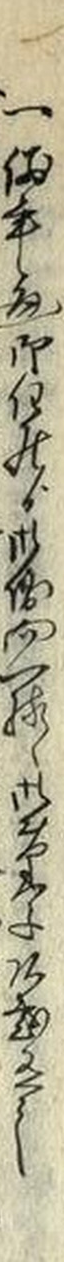一例年之通御住居ゟ御側向一統へ御菓子頂戴有之
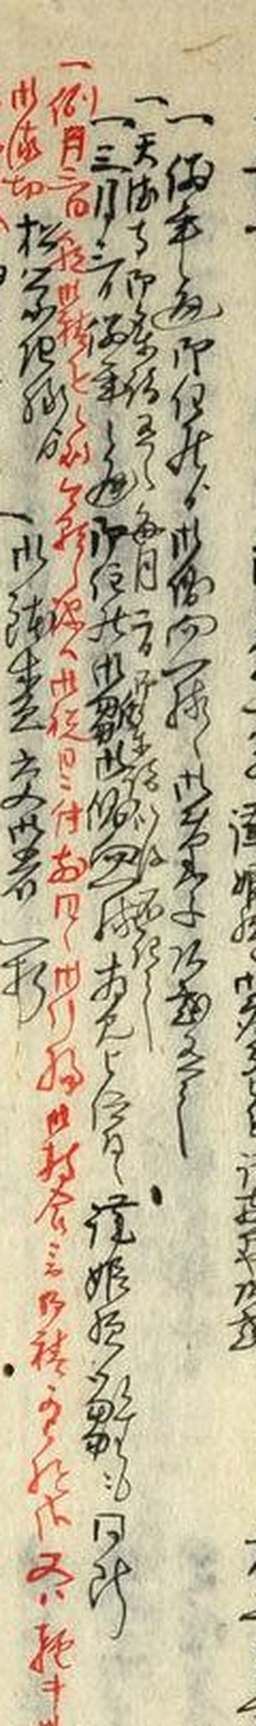一三月三日例年之通御住居御雛御側向一統拝見被仰付候謹姫様御雛も同断
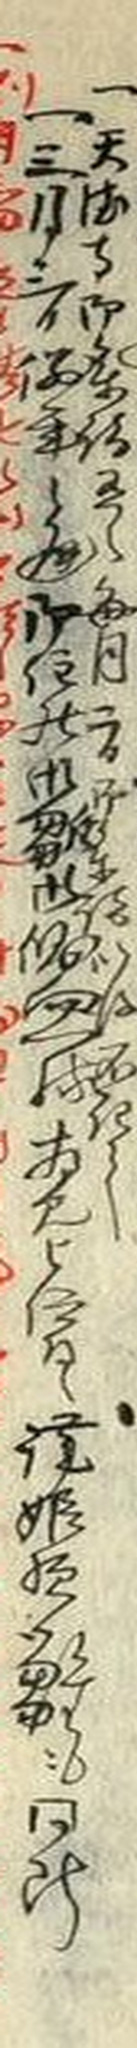一三月三日例年之通御住居御雛御側向一統拝見被仰付候謹姫様御雛も同断
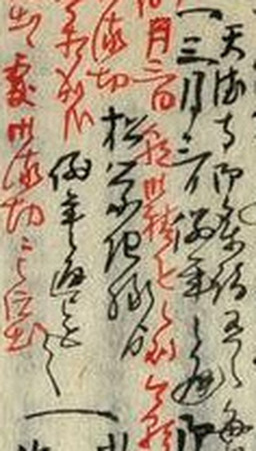松栄院様ゟ
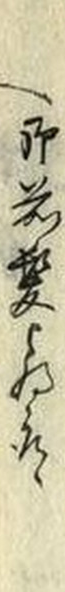御前髪被為取候
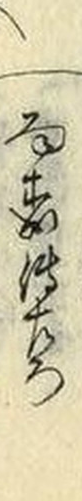同雨森伝左衛門
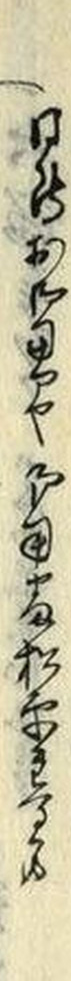同断於御用部屋御用番松平主馬方
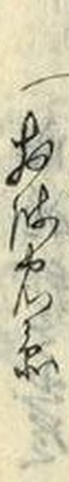前波忠兵衛
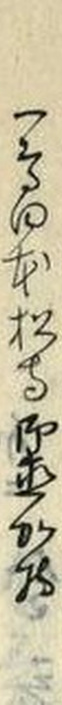一高田本松寺御直加持
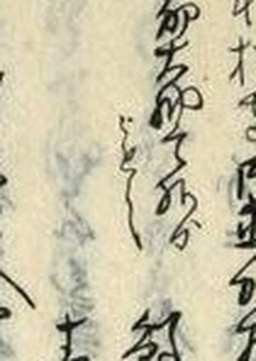被進之
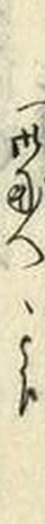御用人へ被下
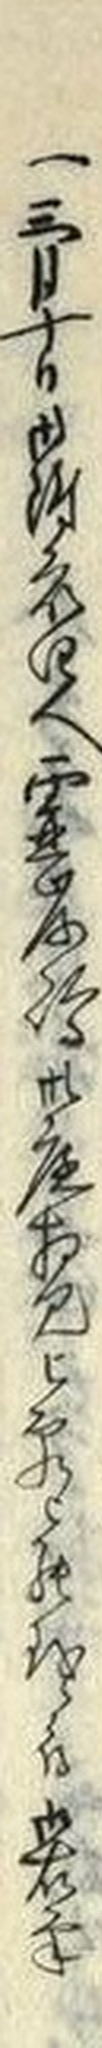一三月十日御附衆四人霊岸嶋御庭拝見被願被罷越候ニ付御右筆
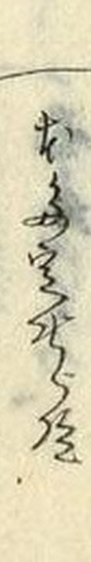本多定次郎殿
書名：少傅日録抄（斉善付側向頭取日記、在府）
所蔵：福井県文書館 Fukui Prefectural Archives
